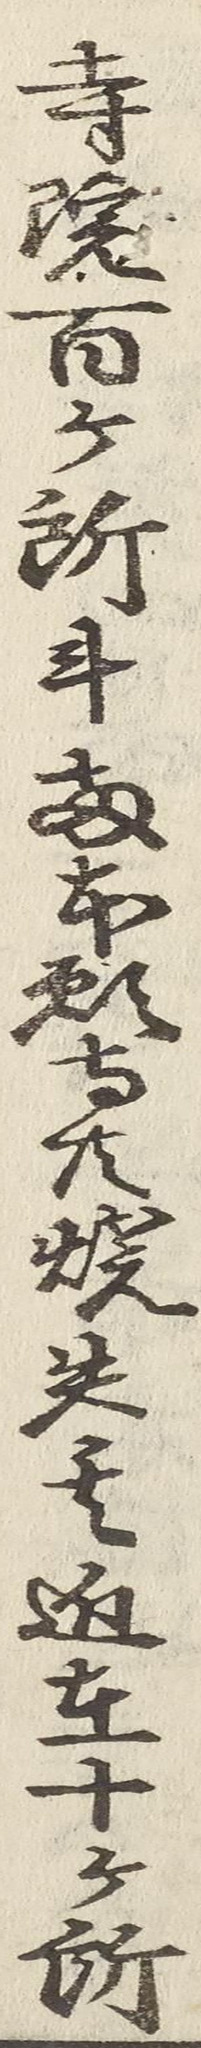寺院百ヶ所斗南本願寺共焼失其近在十ヶ所

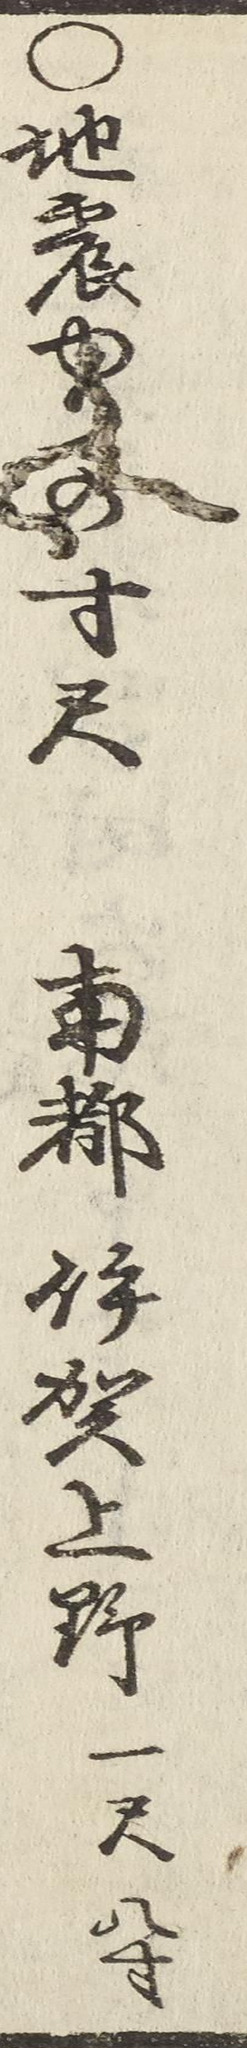○地震ゆりの寸尺南都伊賀上野一尺八寸
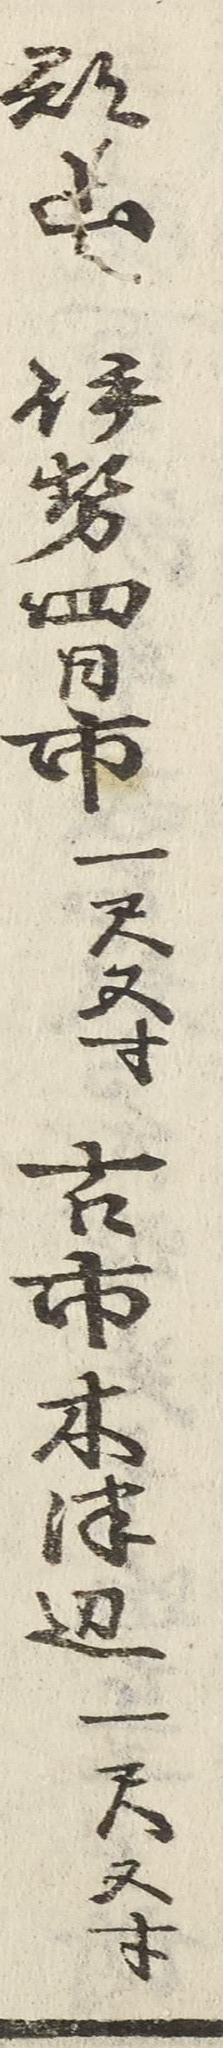郡山伊勢四日市一尺五寸古市木津辺一尺五寸
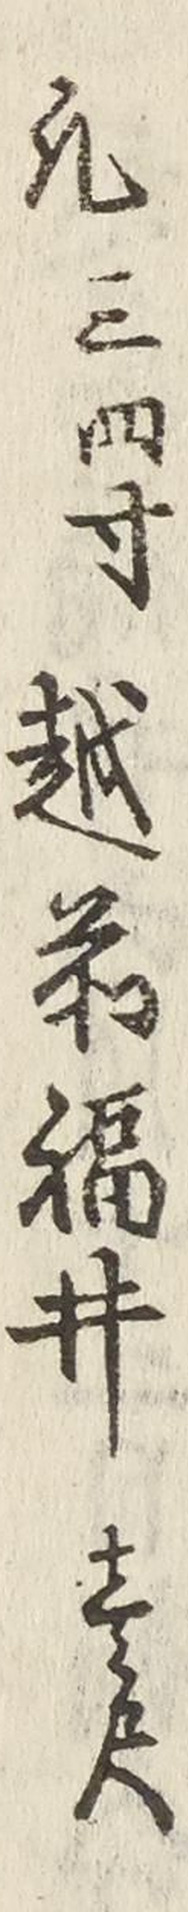凡三四寸越前福井一尺
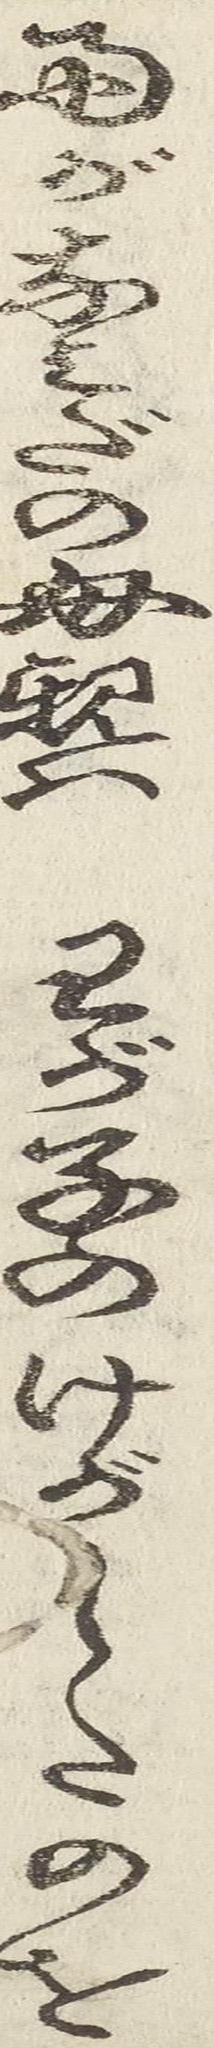雨がなみだの母親はわが子のけがしたのを

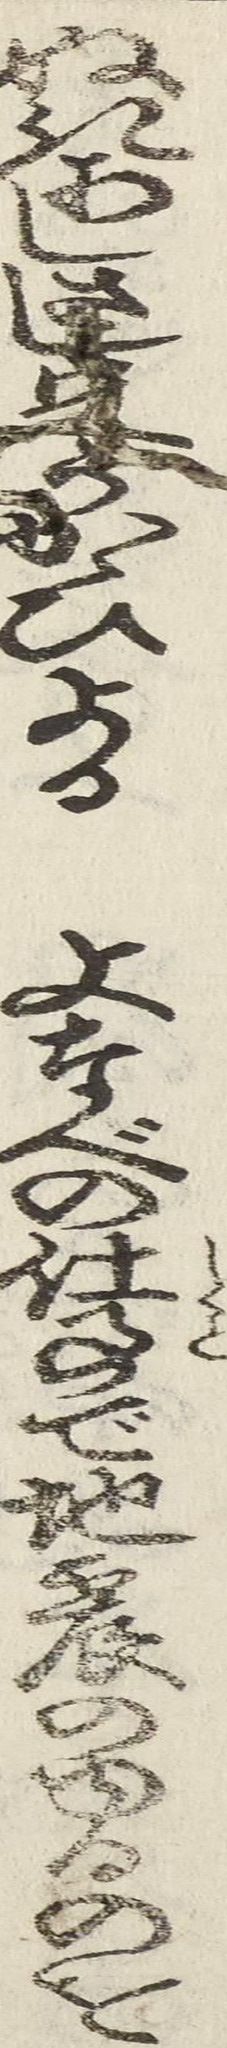ぬきあしさし足うかゝひよるよなべの仕事しことで地震のゆるのを
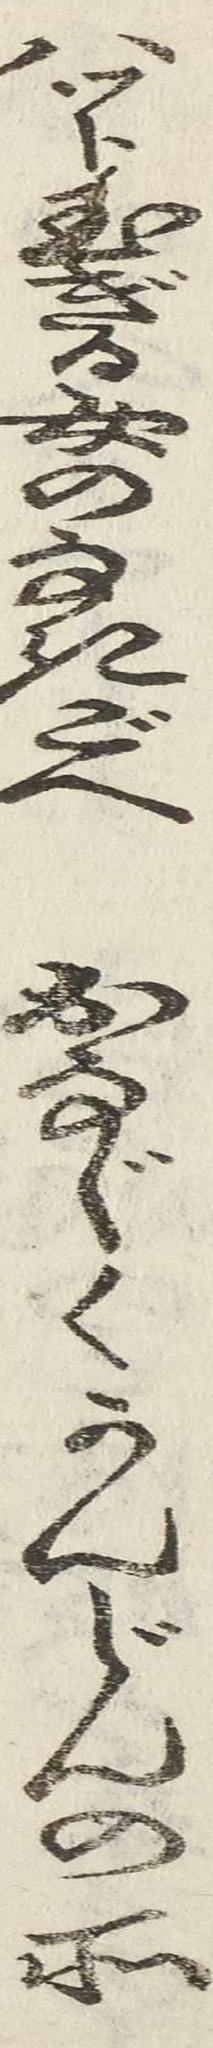ハツト玉ぎる女のなきごへおなじくかんじんの所
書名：大地震世直仕艸紙
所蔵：東京大学地震研究所図書室 Earthquake Research Institute Library, The University of Tokyo, JAPAN
